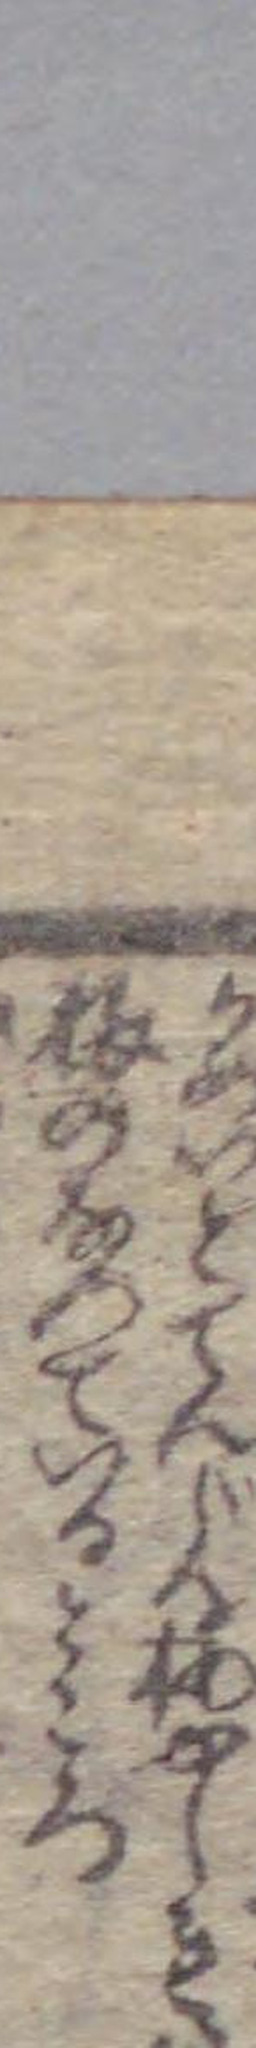梅のなつているところ
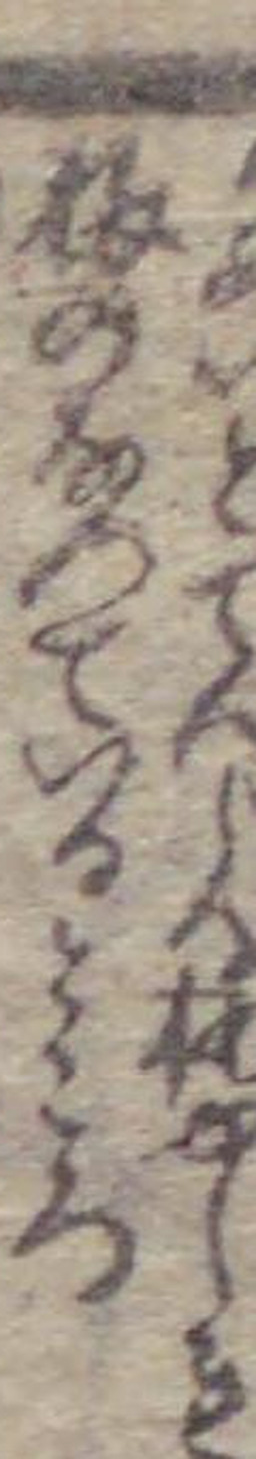梅のなつているところ
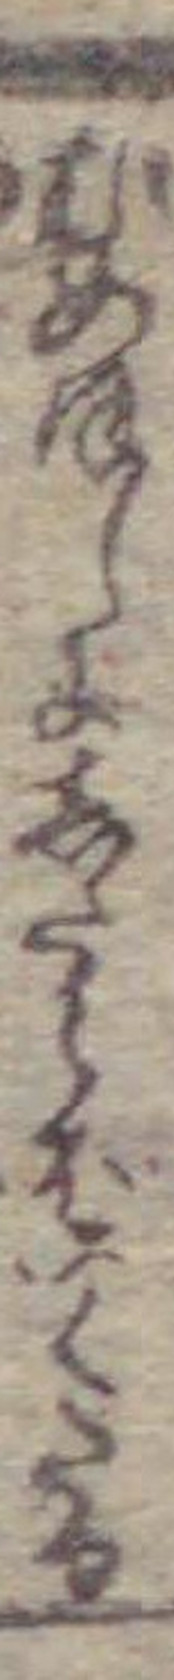むめほしにしたらばいくたる
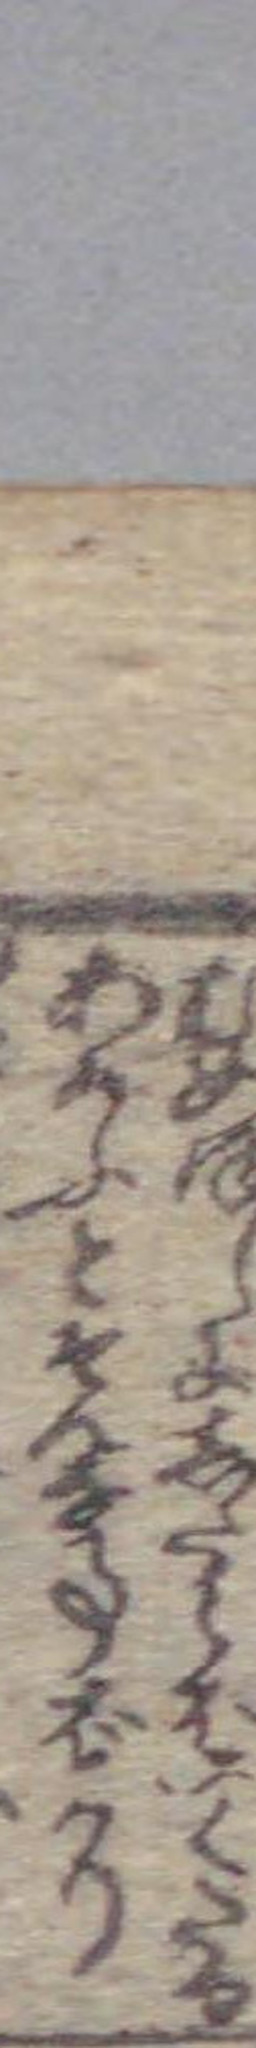あろふとそんな事ばかり
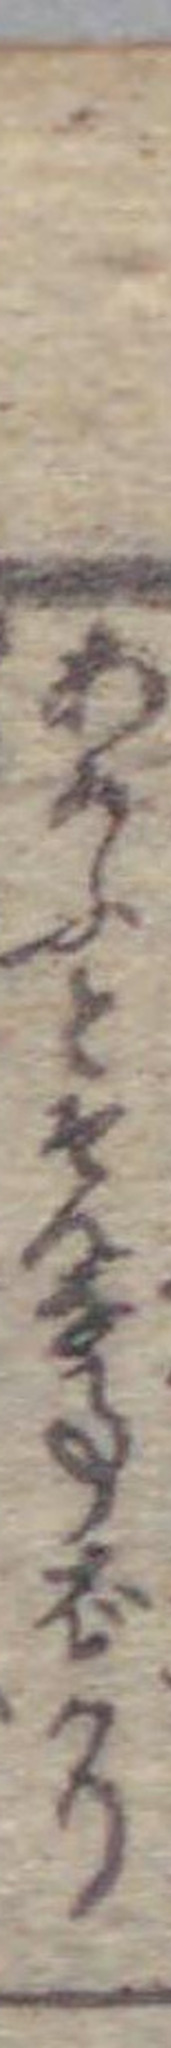あろふとそんな事ばかり
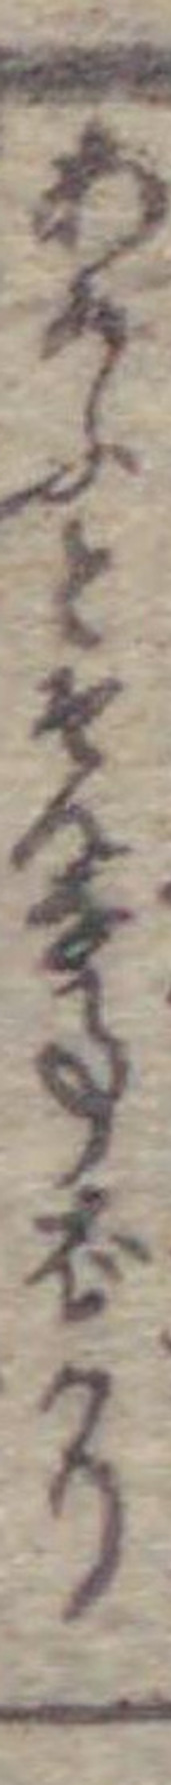あろふとそんな事ばかり
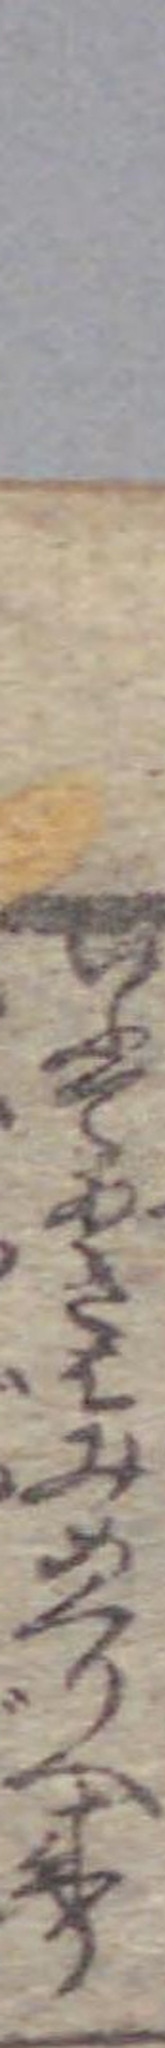いふてあきはみめくりへ来り
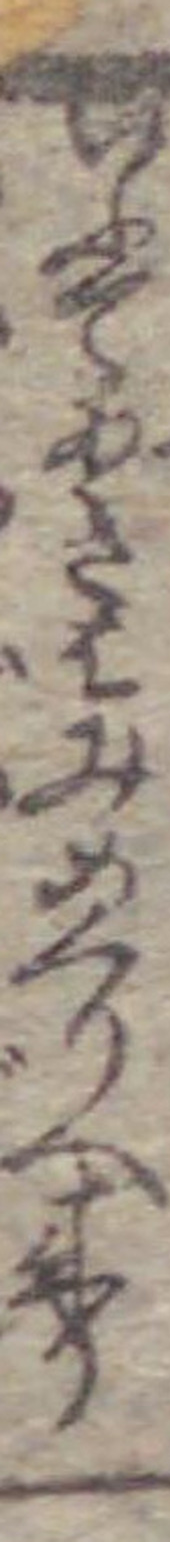いふてあきはみめくりへ来り
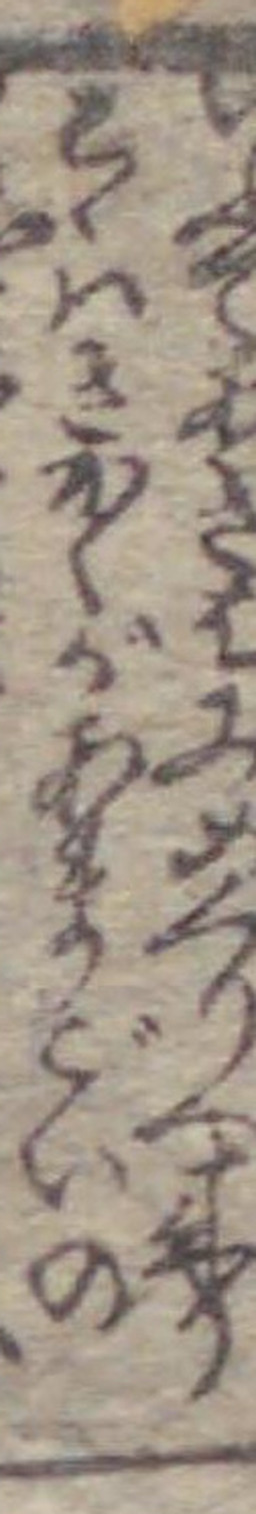こゝはきかくがあまごいの
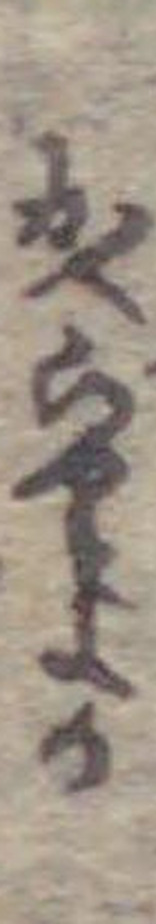かへらりよか
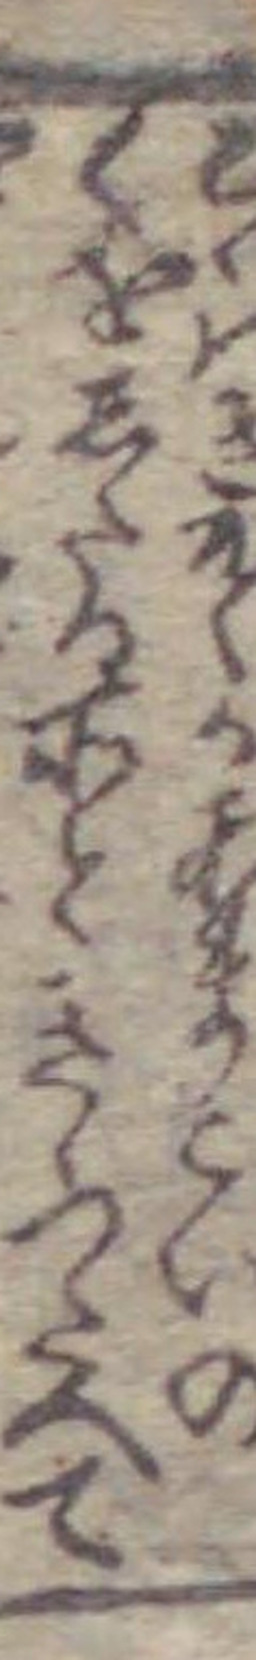くをしたる所と聞きつたへて
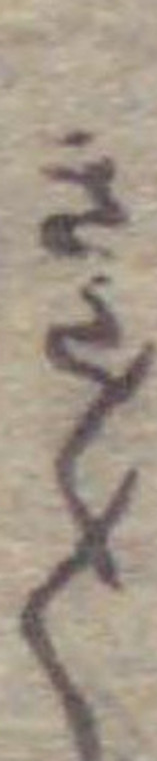きた〳〵〳〵
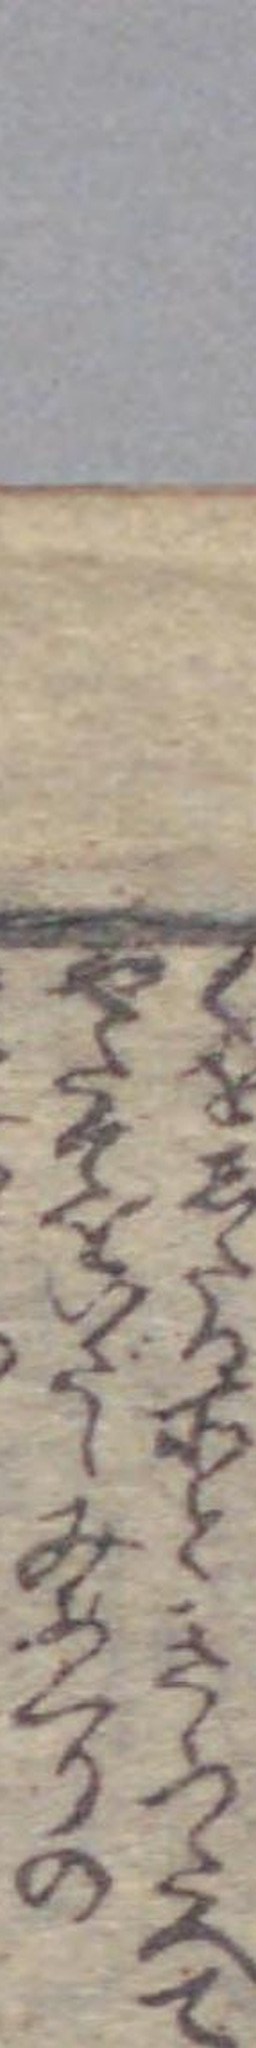やたてをいだしみめくりの
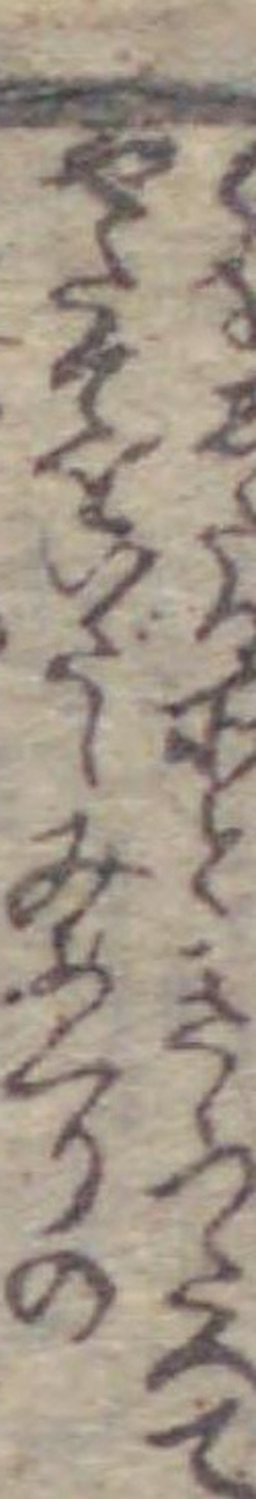やたてをいだしみめくりの
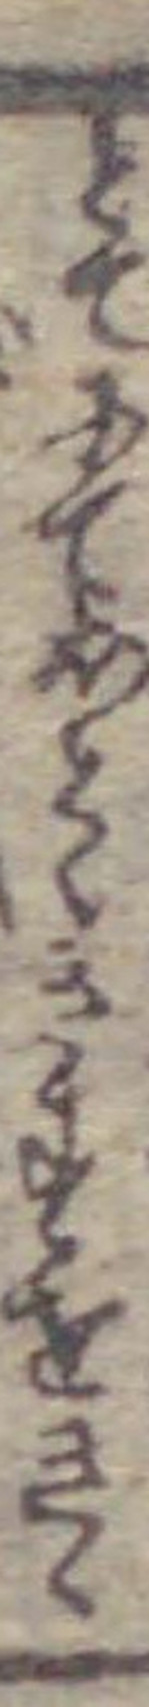とてにてほとゝきすをきゝ
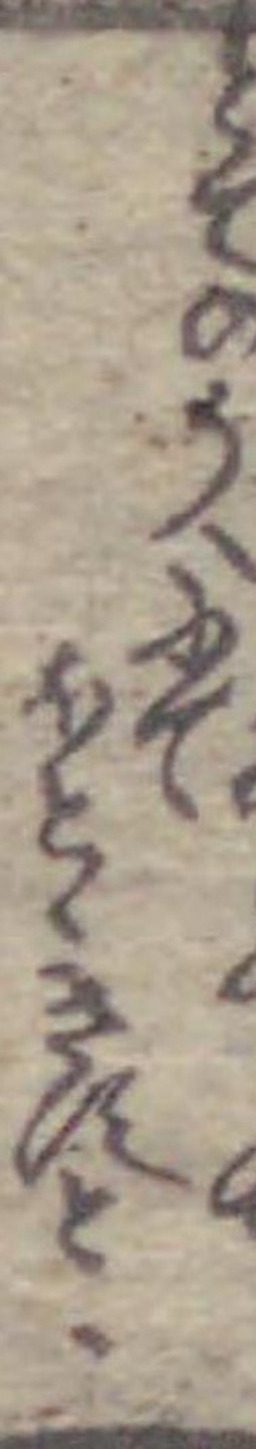ほとゝきすと
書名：見通占 : 3巻
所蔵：国立国会図書館 National Diet Library, JAPAN
